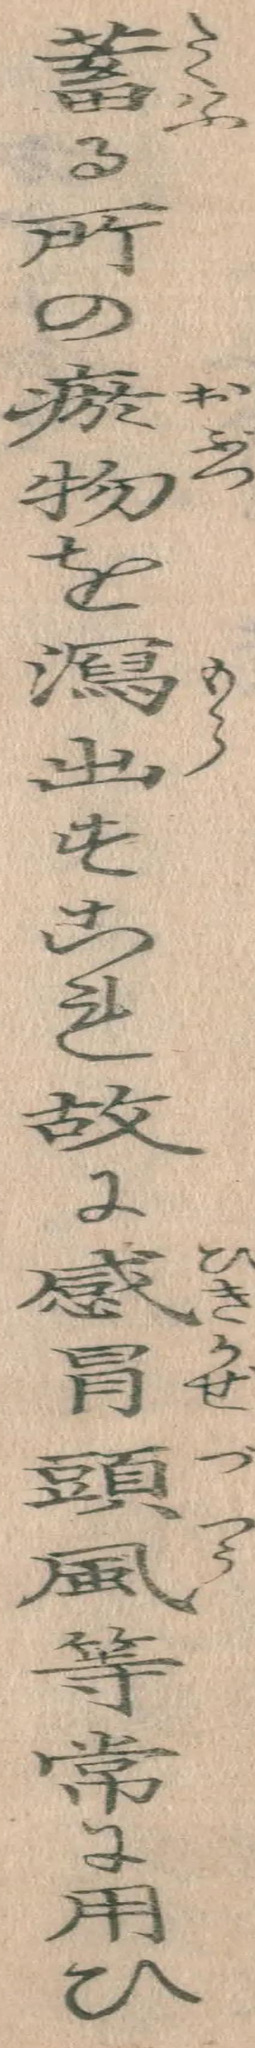蓄る所の瘀物を瀉出すこれ故に感冒頭風等常に用ひ
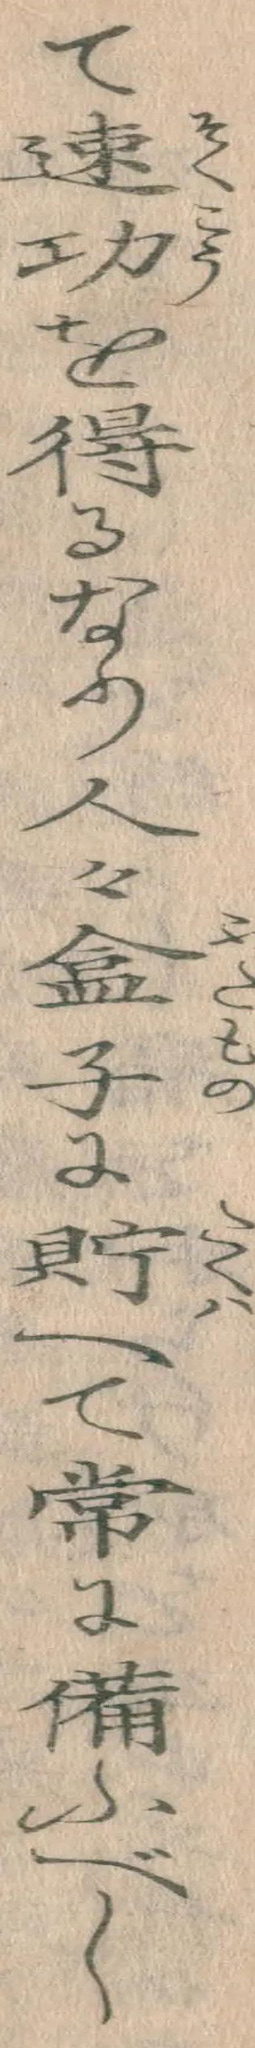て速功を得るなり人々盒子に貯へて常に備ふべし
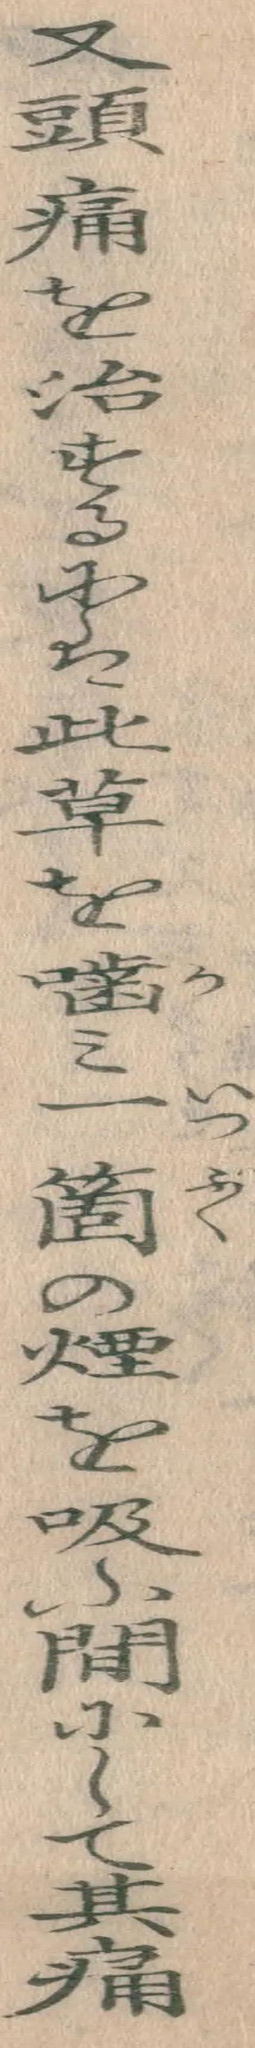又頭痛を治するには此草を嚙み一箇の煙を吸ふ間にして其痛
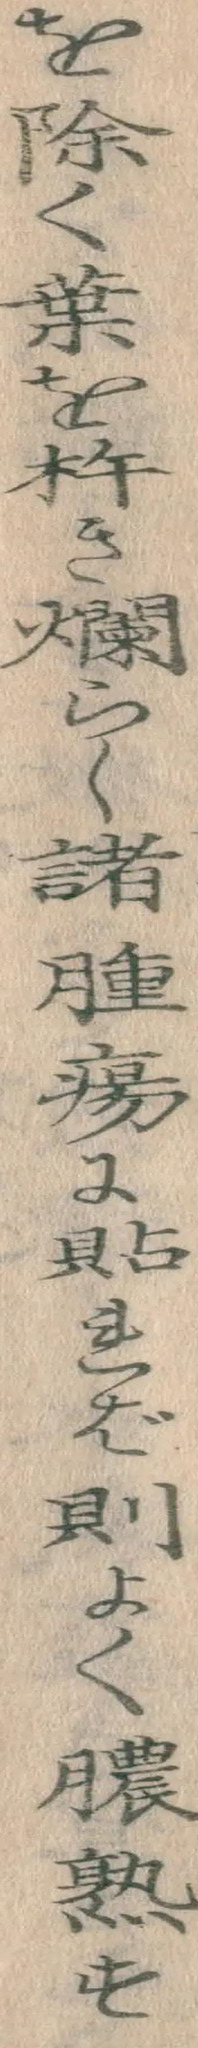を除く葉を杵き爛らし諸腫瘍に貼れば則よく膿熟す
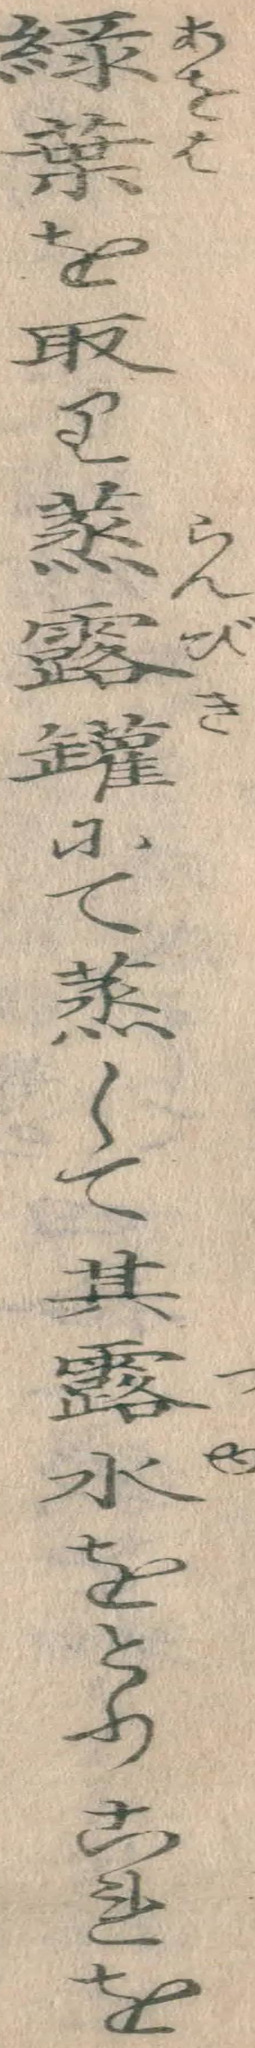緑葉を取り蒸露缶にて蒸して其露水をとりこれを
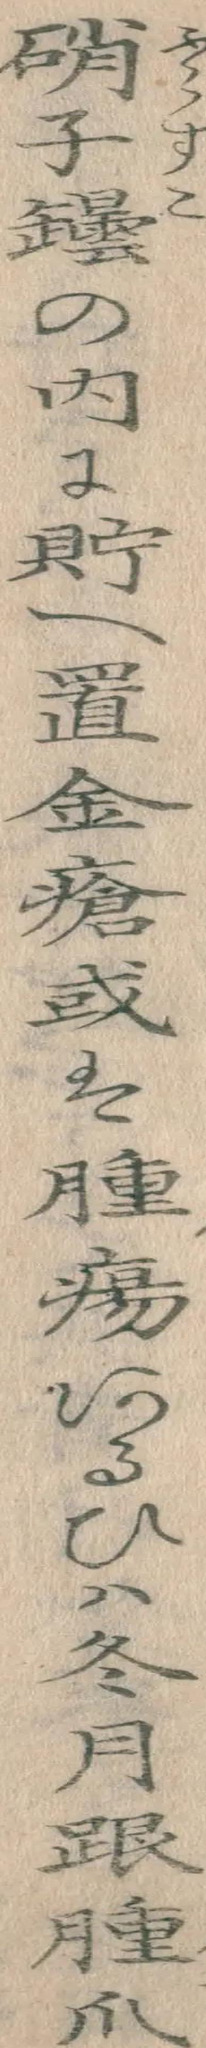硝子罎の内に貯へ置金瘡或は腫瘍あるひは冬月跟腫爪
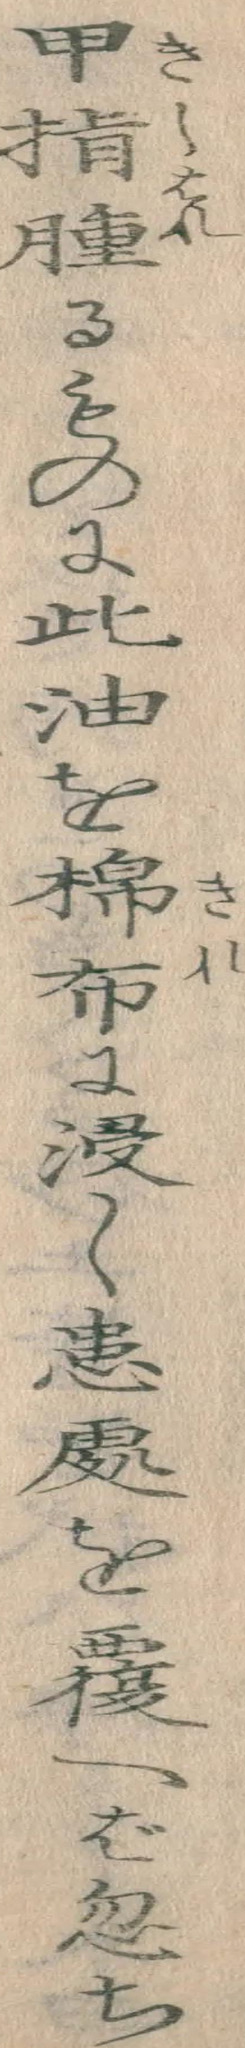甲指腫るものに此油を棉布に浸し患処を覆へば忽ち
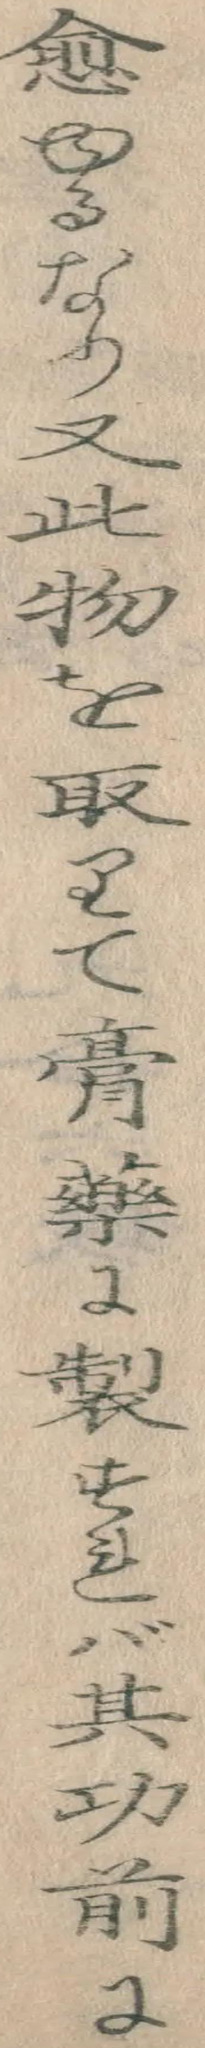愈ゆるなり又此物を取りて膏薬に製すれば其功前に
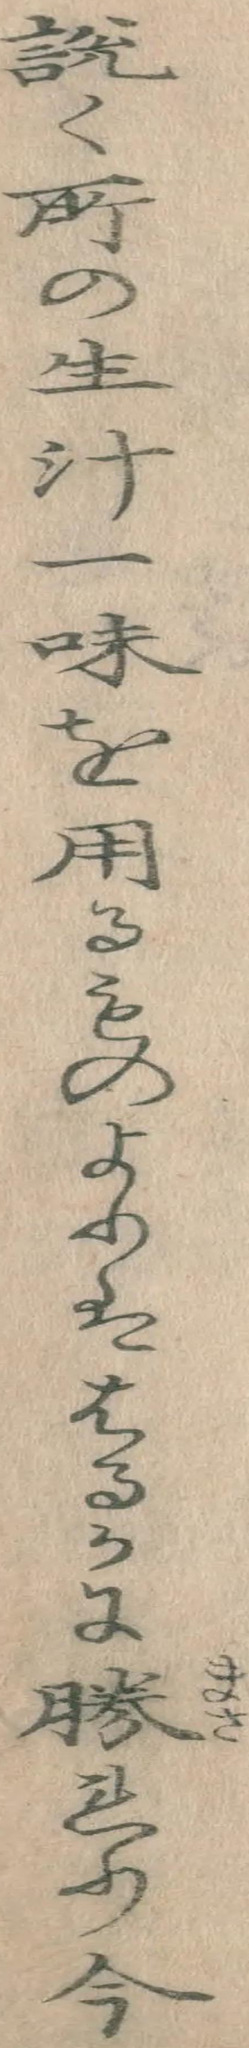説く所の生汁一味を用るものよりははるかに勝れり今

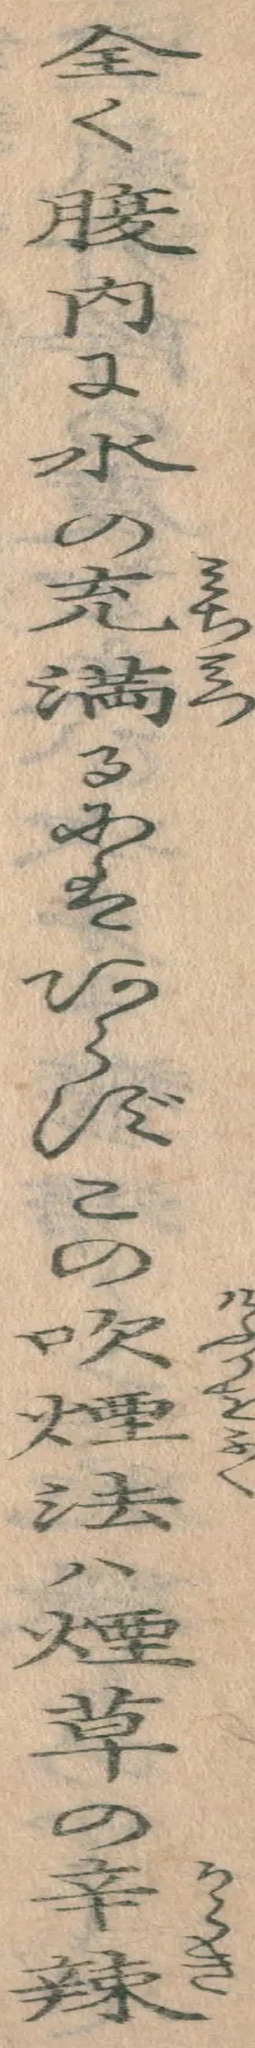全く腹内に水の充満るにはあらずこの吹煙法は煙草の辛辣
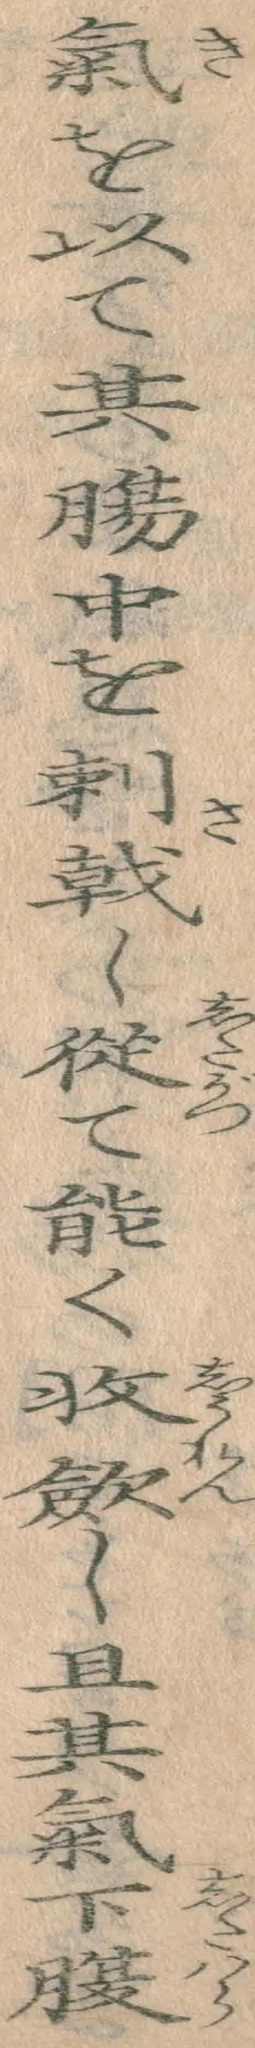気を以て其膓中を刺戟し從て能く収斂し且其気下腹
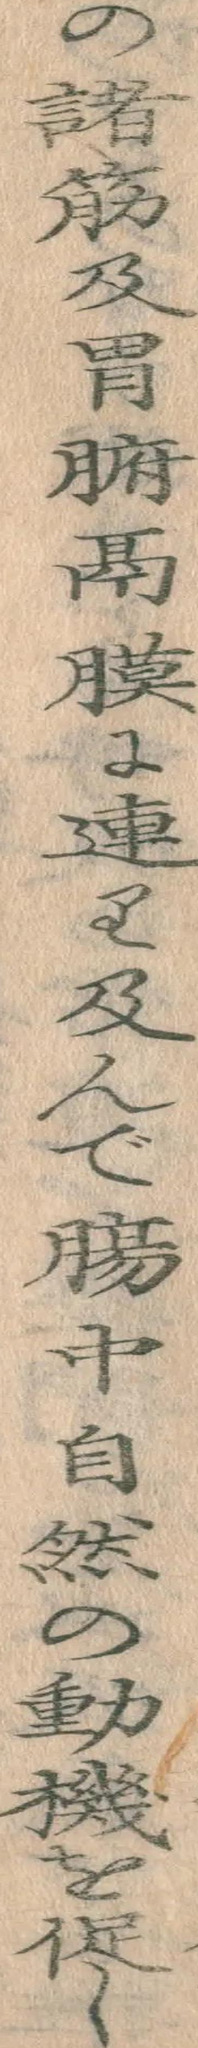の諸筋及胃腑鬲膜に連り及んで膓中自然の動機を促し
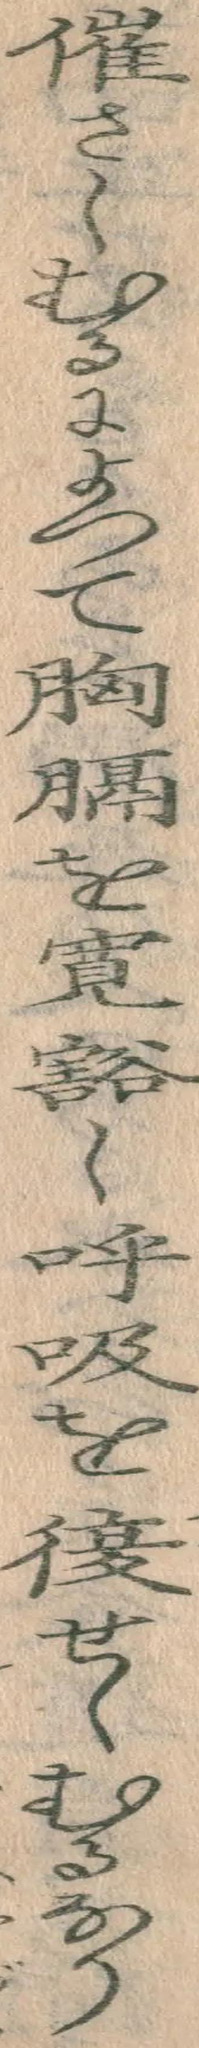催さしむるによつて胸隔を寛豁し呼吸を復せしむるなり
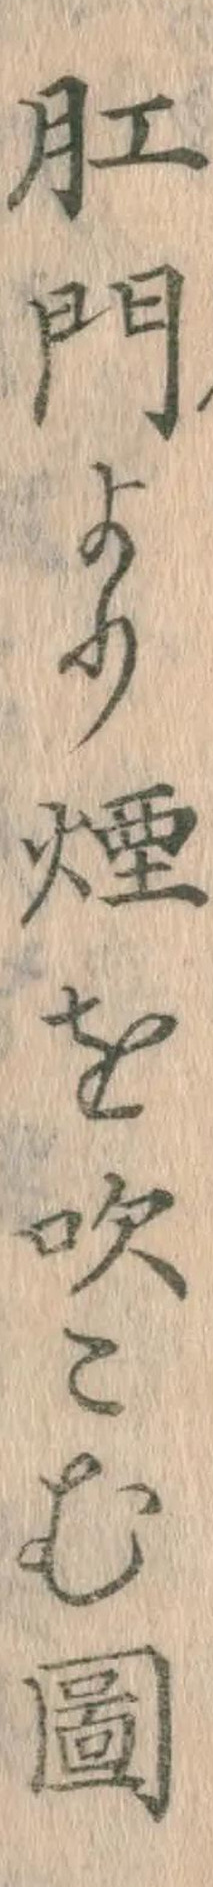肛門より煙を吹きこむ図
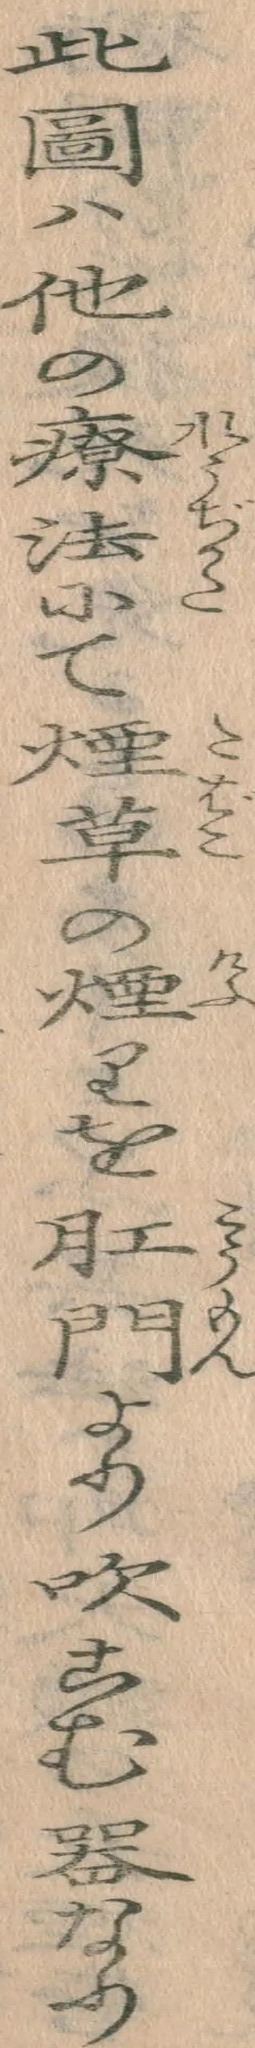此図は他の療法にて煙草の煙りを肛門より吹こむ器なり
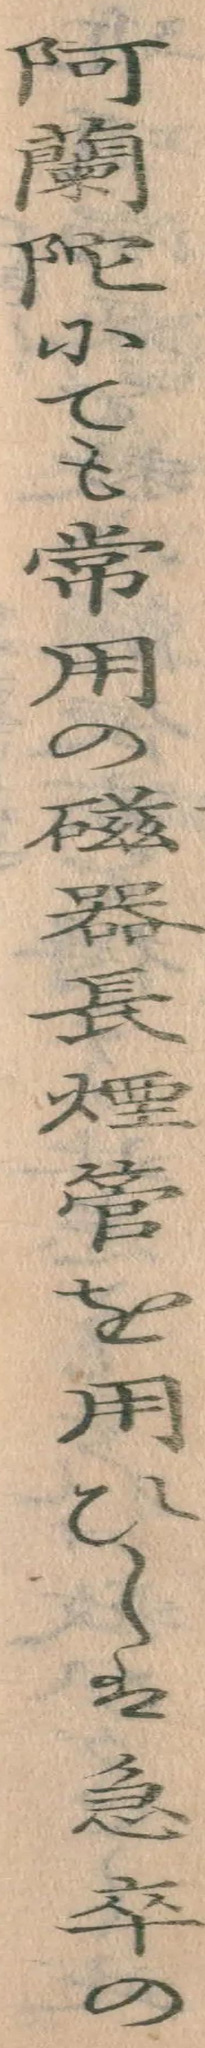阿蘭陀にても常用の磁器長煙管を用ひしは急卒の
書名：目さまし草
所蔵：国立国会図書館 National Diet Library, JAPAN
